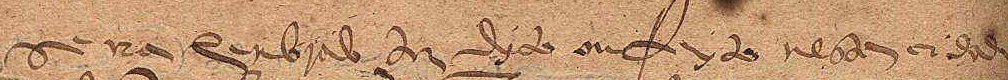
se era lembrado ter dyto ou feyto nesta cidade
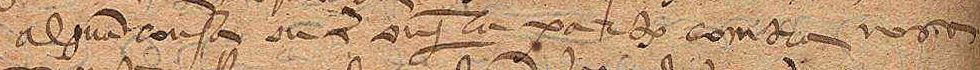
algūa cousa ou ē outra partꝭ comtra nosa
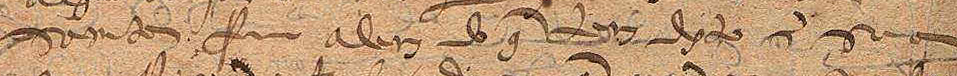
samta fee alem do q̅ tem dyto e̅ sua
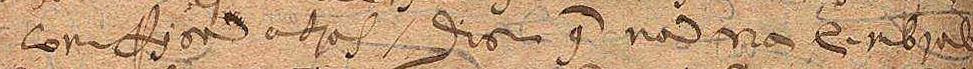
comfysā atras / dise q̄ nā era lembrado
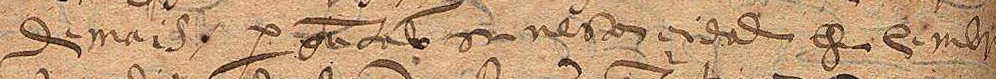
de mais / ꝑgu̅tado se nesta cidade lhe lembra
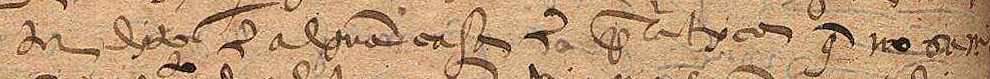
ter dyto e̅ algu̅a casa e̅ pratyca q̅ no sam
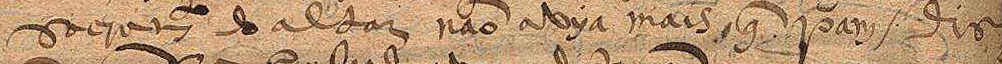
sacramto do altar não avya mais, q̅ pam /. dise
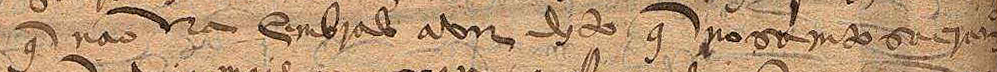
q̄ não era lembrado aver dyto q̄ no samto sacram
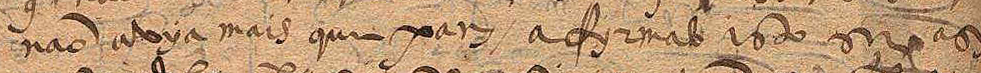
não avya mais que pam / afyrmado isto ser asy
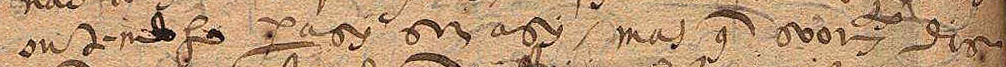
ou temdo ho ꝑa sy ser asy / mas q̅ soomte dise
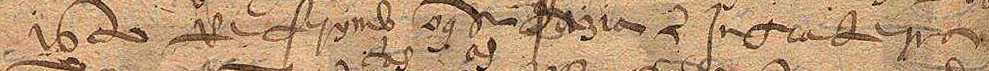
isto Referymdo o q̅ se fazia e̅ Jngraterra
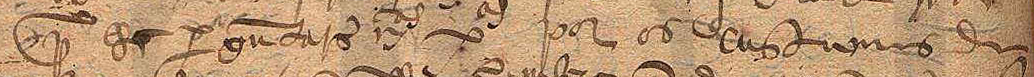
p̄o lhe ꝑgūtarē mtas pas por os custumes de
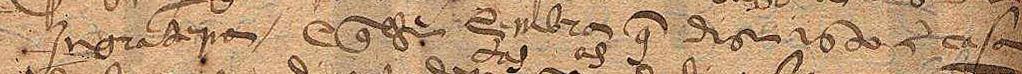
Jngraterra / e q̄ lhe lembra q̄ dise isto ē casa
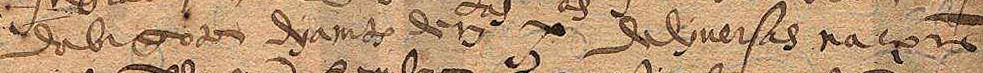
dabegota dyamte de mtas pas de dyuersas naçoēs
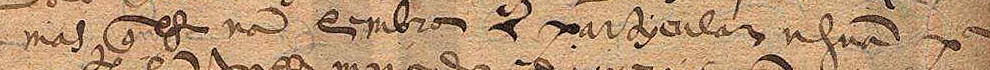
mas q̅ lhe na̅ lembra e̅ partycular nhu̅a pa
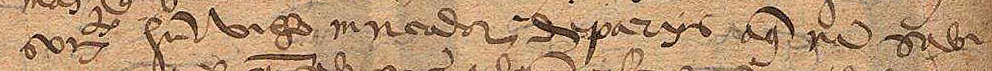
somtꝭ hu̅ velho mercador de parys a q̅ nā sabe
